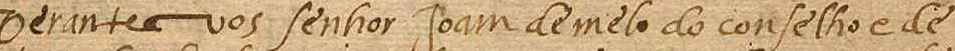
Perante vos senhor Joam de melo do conselho e de
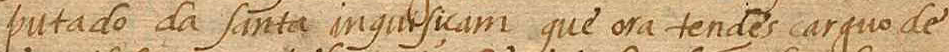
putado da santa inquisiçam que ora tendes carguo de
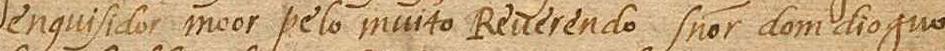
enquisidor moor pelo muito Reuerendo snōr dom dioguo
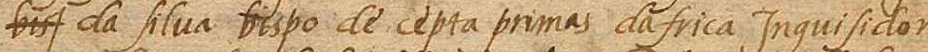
bisp da silua bispo de cepta primas dafrica Jnquisidor
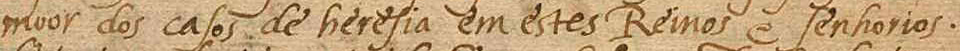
moor dos casos de heresia em estes Reinos e senhorios
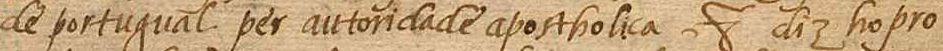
de portugual per autoridade apostholica c̄ꝭ diz ho pro
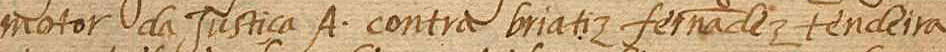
motor da Justiça A. contra briatiz fern̄adez tendeira
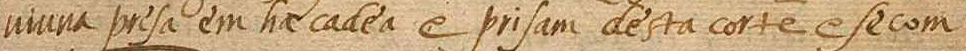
uiuua presa em ha cadea e prisam desta corte e se com
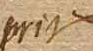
prir
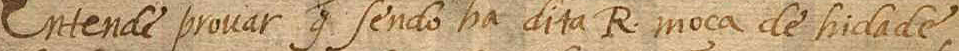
Entende prouar q̄ sendo ha dita R. moça de hidade
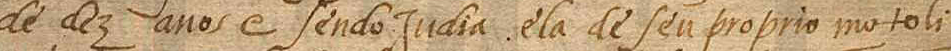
de dez anos e sendo Judia ela de seu proprio moto li
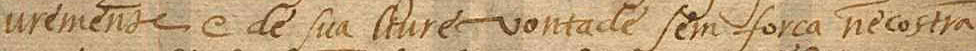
uremente e de sua liure vontade sem força n̄e cost̄ra
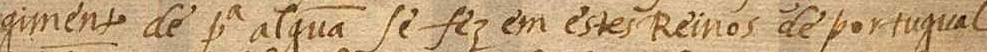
gimento de pa algūa se fez em estes Reinos de portugual
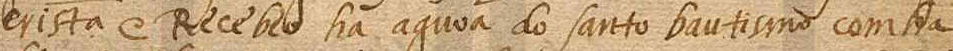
cris̄ta e Recebeo ha aguoa do santo bautismo com ha
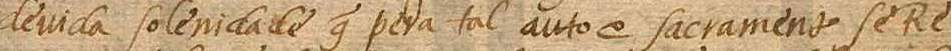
deuida solenidade q̄ pera tal auto e sacramento se Re
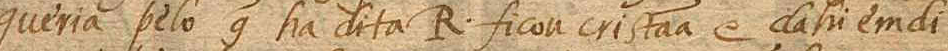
queria pelo q̄ ha dita R. ficou cristāa e dahi em di
